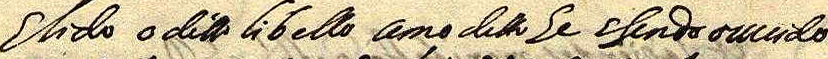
E lido o ditto libello como ditto he E sendo ouuido
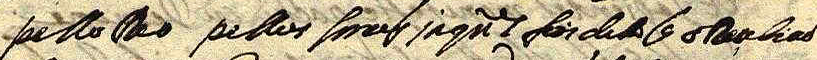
pello Reo pello Snres̄ jnqures foi dito q̄ o Reçebiaõ
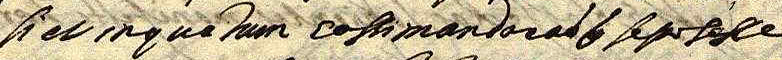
si et in quātum E assi mandaraõ q̄ se posesse
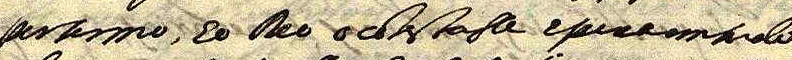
per termo, E o Reo o cōtestasse E pera em tudo
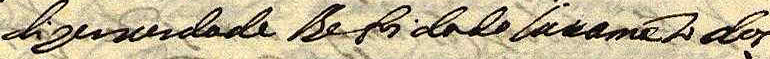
dizer uerdade lhe foi dado Iuramēto dos
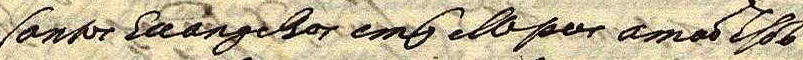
santos Euangelhos em q̄ elle pos a maõ E sob
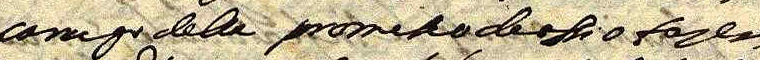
carrego delle prometeo de assi o fazer,
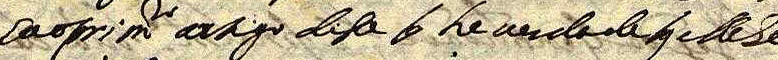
E ao primro artigo disse q̄ he uerdade q̄ elle he
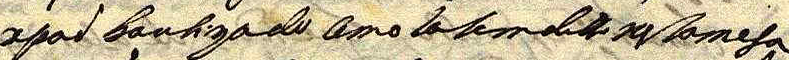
xpaõ bautizado como Ia tem ditto nesta mesa
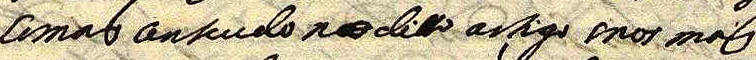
E o mais conteudo no ditto artigo e nos mais
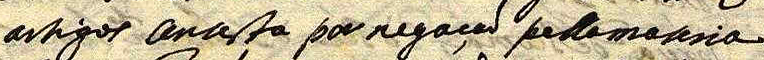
artigos contesta por negaçaõ pella materia
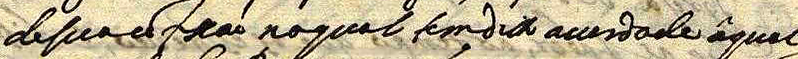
de sua cōfissaõ na qual tem ditto a uerdade â qual
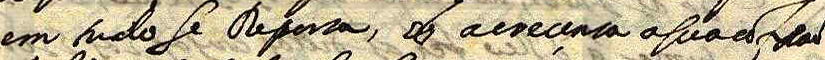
em tudo se Reporta, E q̄ acreçenta a sua cōfissaõ
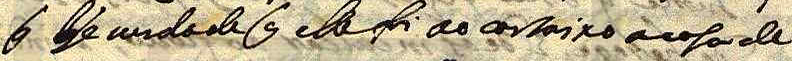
q̄ he uerdade q̄ elle foi ao cartaixo a casa de
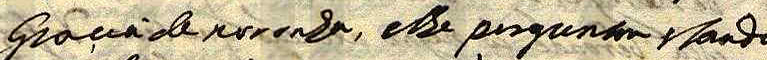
Graçia de noronha, e lhe perguntou estando
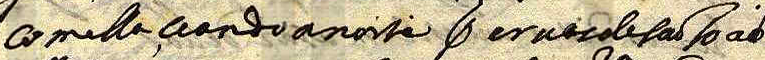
com ella çeando a noite p̄ eruas de saõ Joaõ
